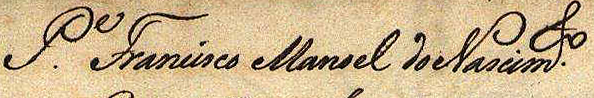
P.e Francisco Manoel do Nascim.to
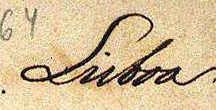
Lisboa
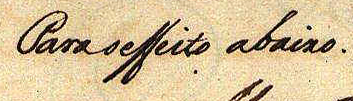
Para o effeito abaixo.
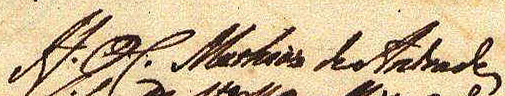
H. OC. Mathias de Andrade
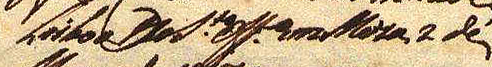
Lisboa No S.to off.o em Meza 2 de
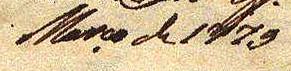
Março de 1779
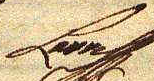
Larre
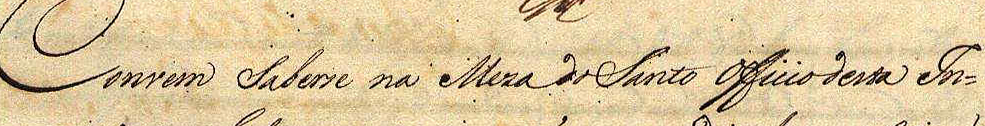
Convem Saberse na Meza do Santo Officio desta In
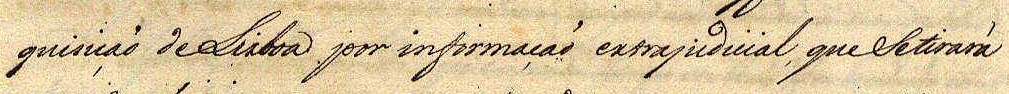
quisiçaõ de Lisboa por informaçaõ extrajudicial, que Se tirará
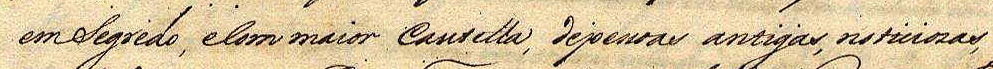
em Segredo, e com maior Cautella, de pessoas antigas, noticiozas,
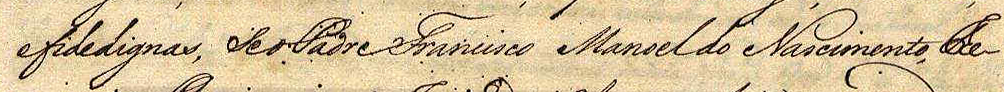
e fidedignas, se o Padre Francisco Manoel do Nascimento, The
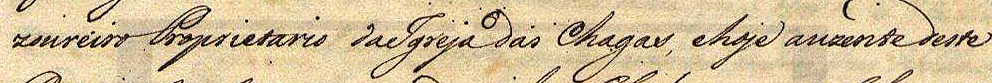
zoureiro Proprietario da Igreja das Chagas, e hoje auzente deste
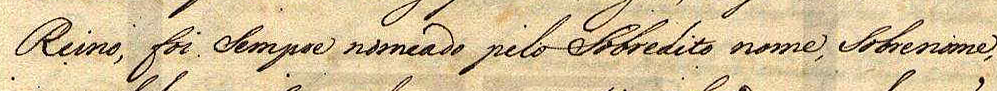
Reino, foi Sempre nomeado pelo Sobredito nome, Sobrenome,
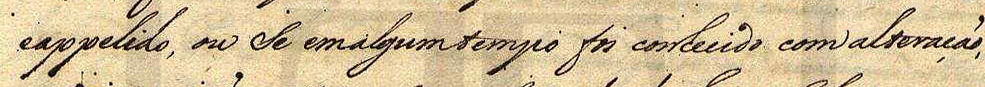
e appelido, ou Se em algum tempo foi conhecido com alteraçaõ,
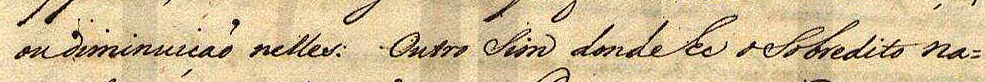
ou diminuiçaõ nelles: OutroSim donde he o Sobredito na
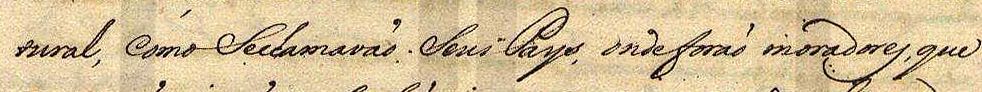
tural, como Se chamavaõ. Seus Pays, onde foraõ moradores, que
